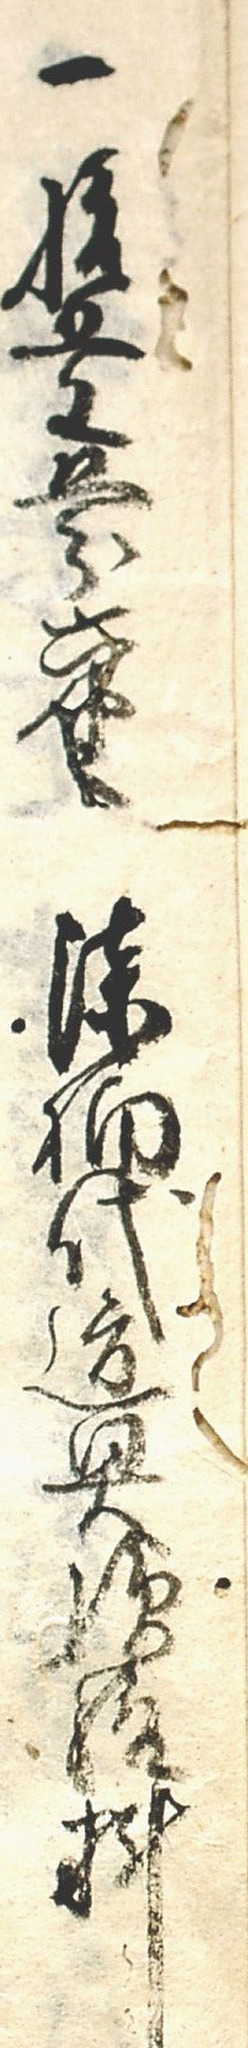一拾五匁五分六厘漆桶代道具損給料
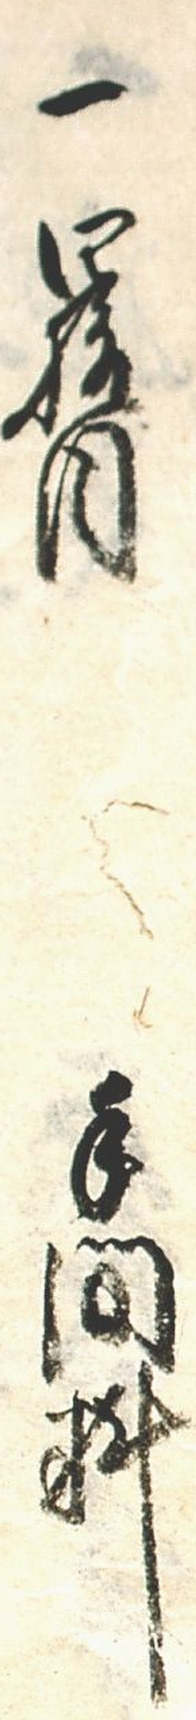一四拾目手間料
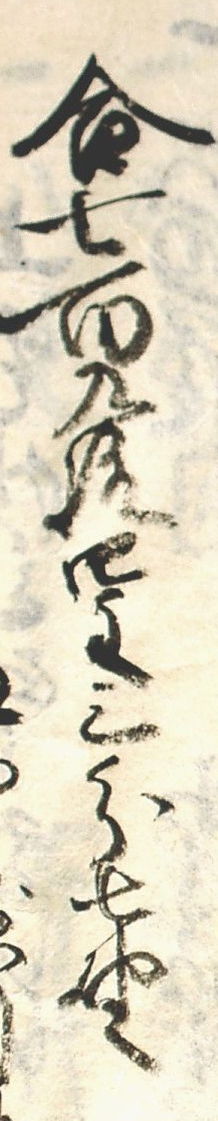合七百九拾四匁三分七厘
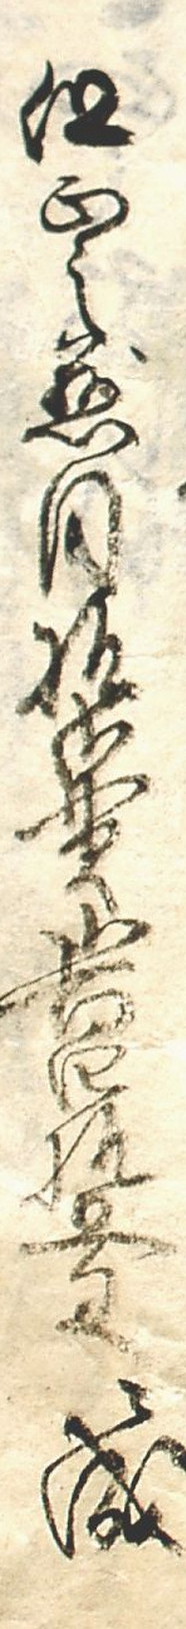但正ミ懸目拾弐貫弐百四拾五匁に成
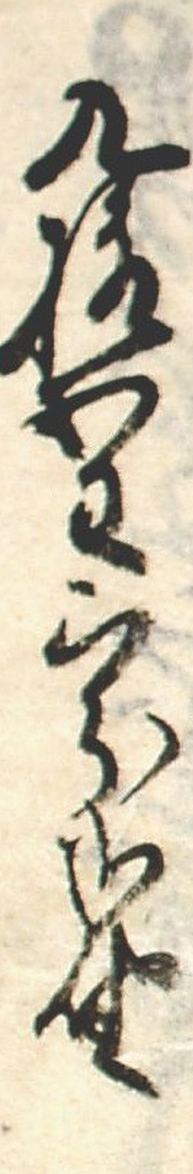九拾五匁三分弐厘
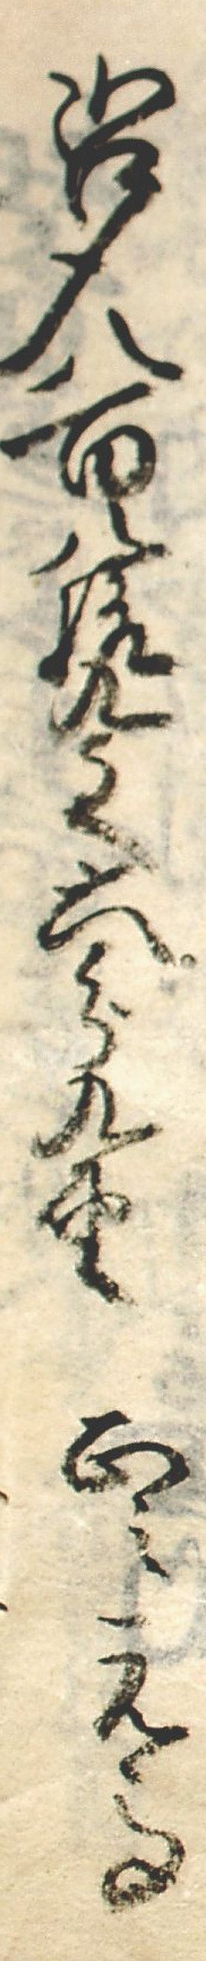弐口〆百八拾九匁六分九厘正ミ元高

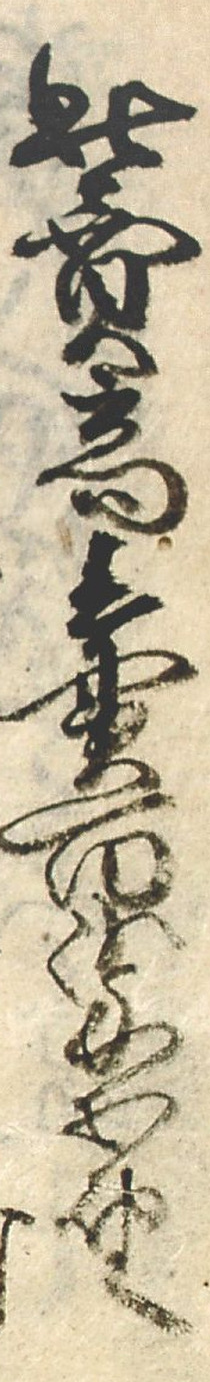此売高壱貫百弐匁七厘
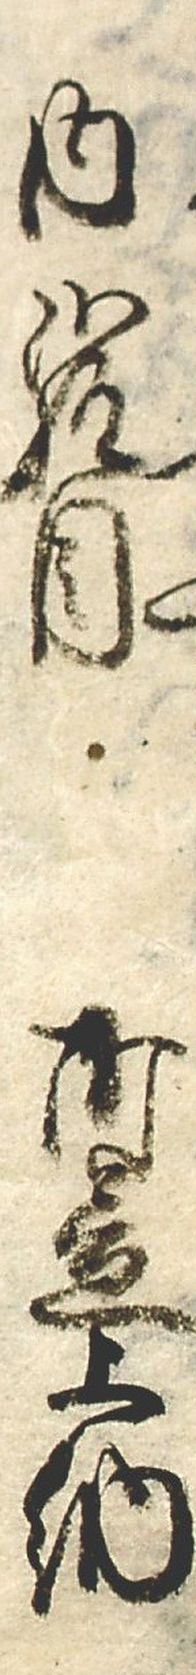内弐拾目御益上納
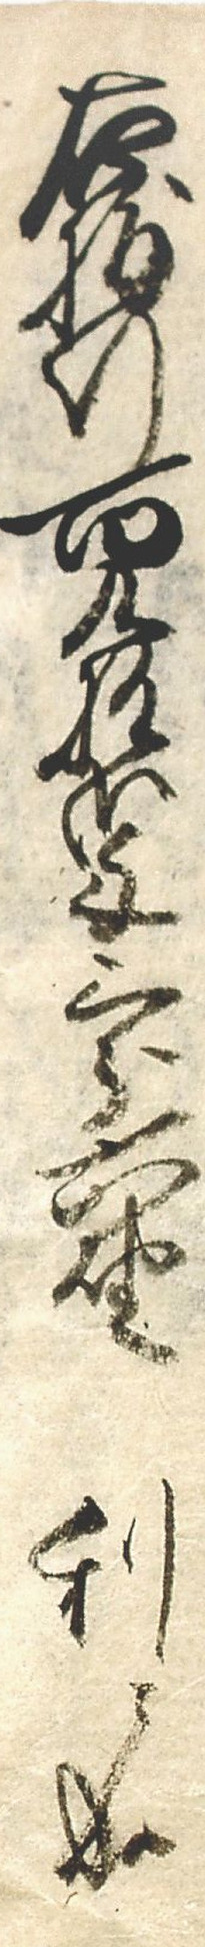右指引百拾弐匁三分六厘利に成
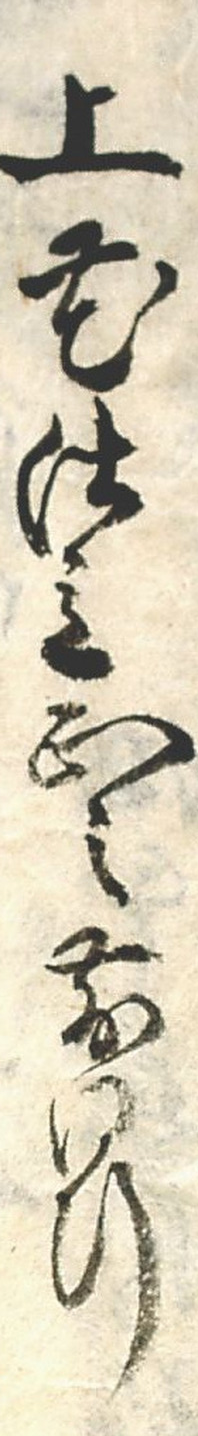上花仕立正ミ前同断
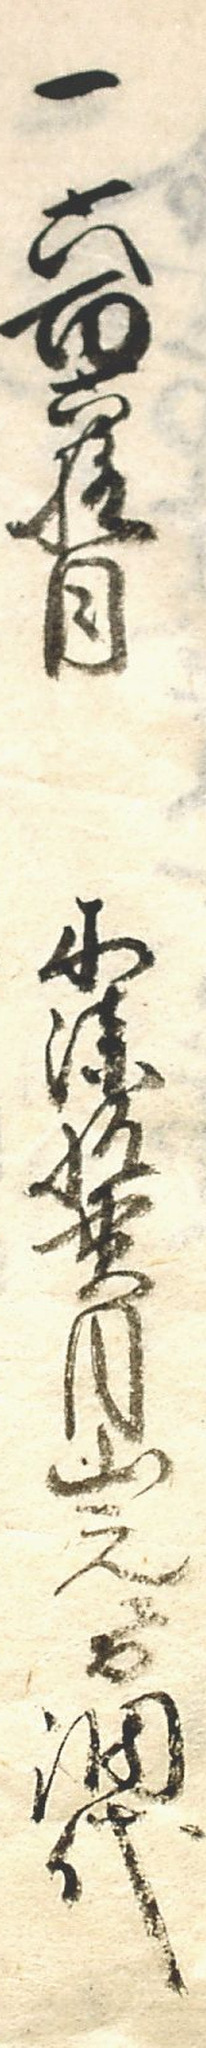一六百六拾目木漆拾貫目山元に而調代
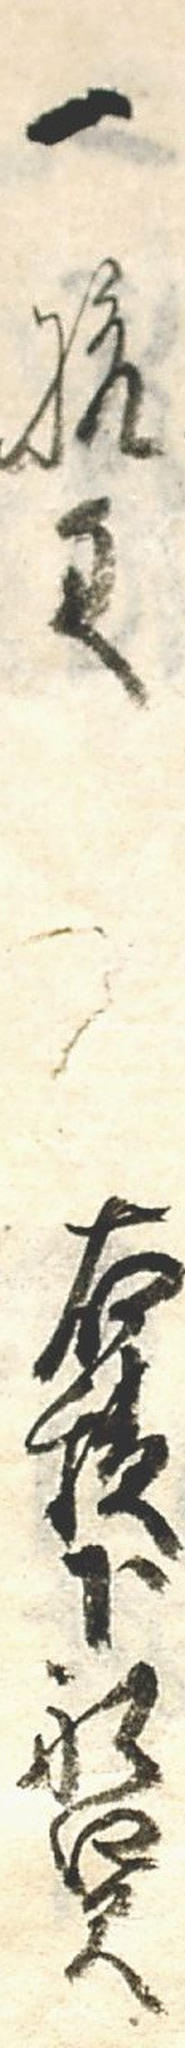一拾匁右積下船賃
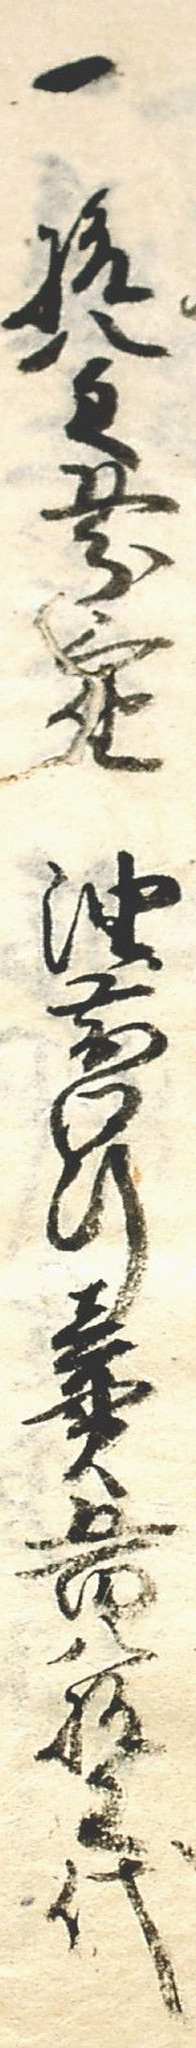一拾八匁五分三厘油前同断壱貫五百八拾匁代
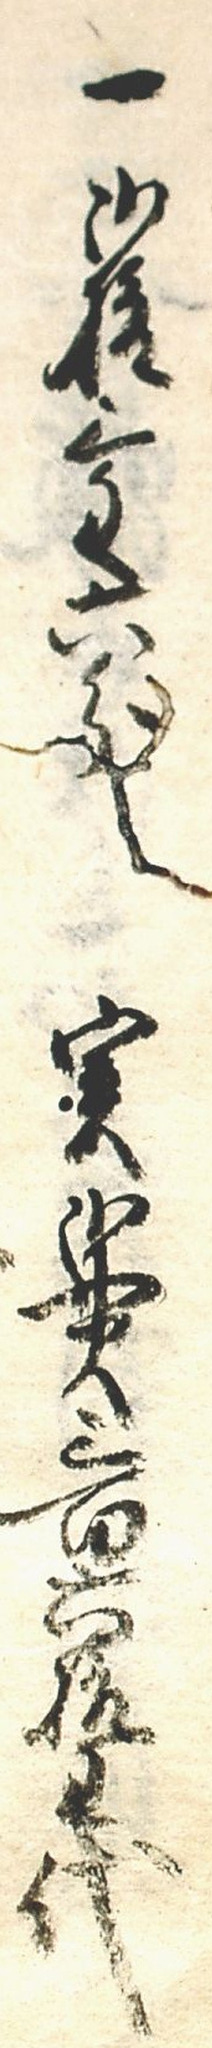一弐拾三匁六分実弐貫三百六拾匁代
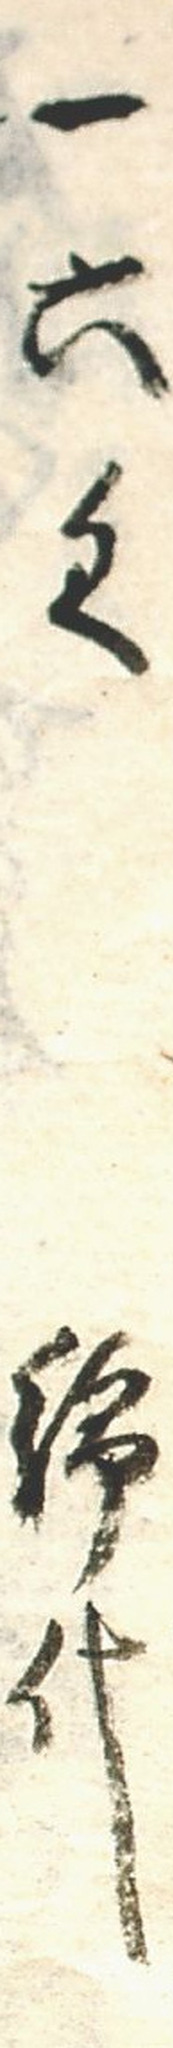一六匁綿代
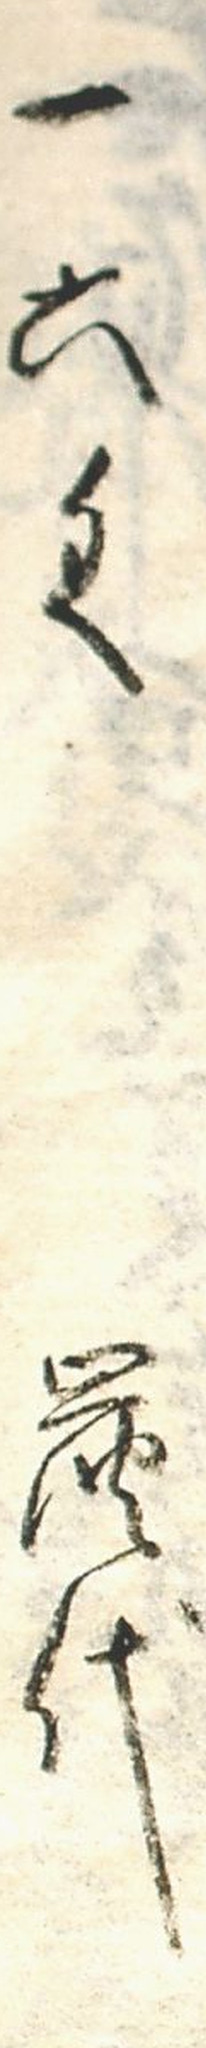一六匁炭代
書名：御国産漆製法越法算建書共取替速判帳
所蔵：鳴門教育大学 Naruto University of Education
